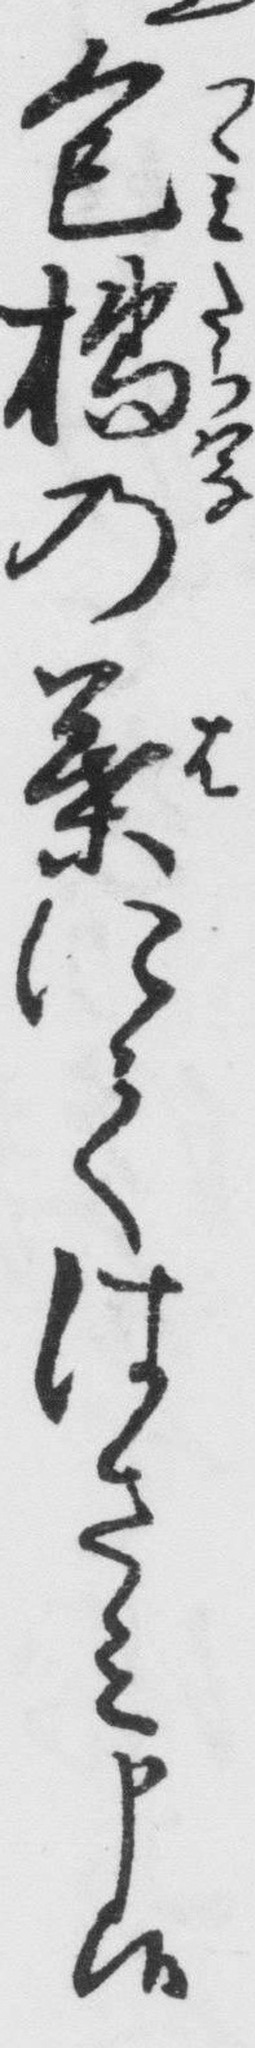包橘の葉にてはさみ申候
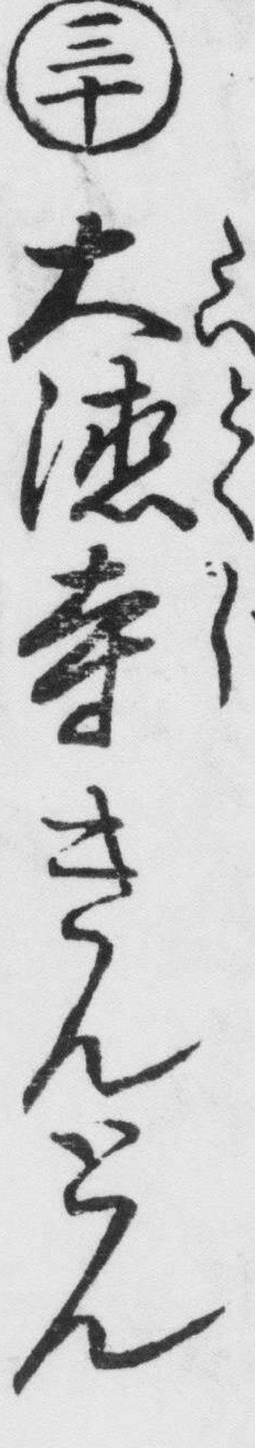(三十)大徳寺きんとん
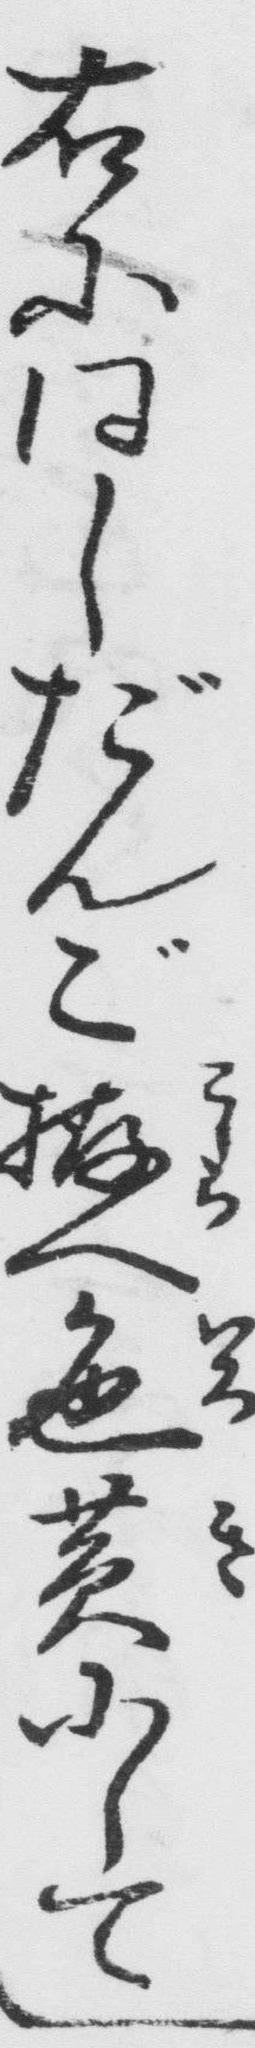右に同しだんご拵へ色黄にして

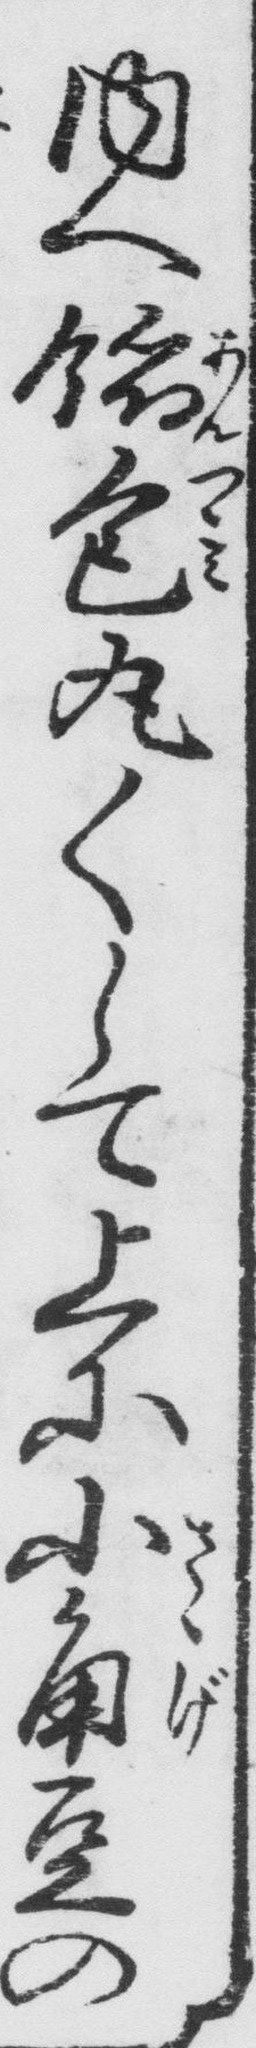内へ餡包丸くして上に小角豆の
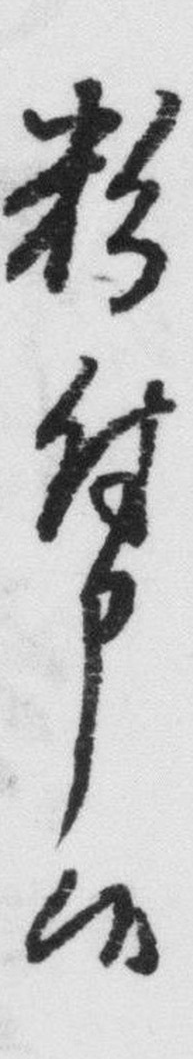粉付申候
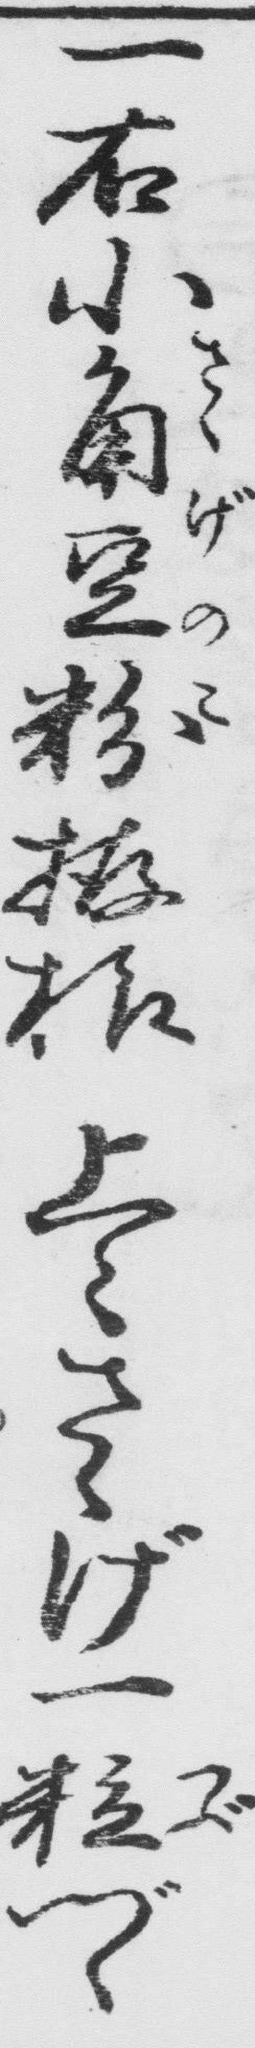一右小角豆粉拵様上々さゝげ一粒づゝ
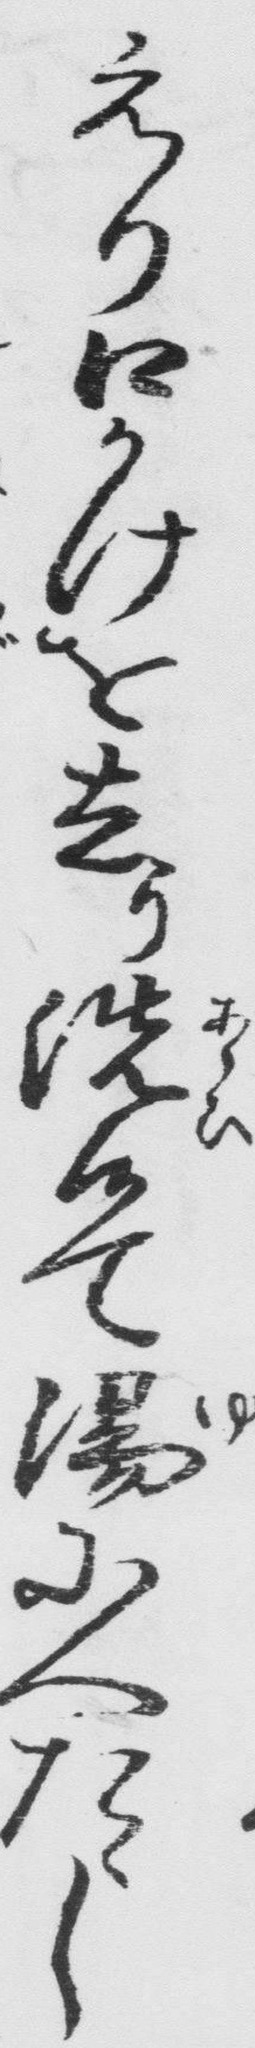ゑり口かけを去り洗候て湯にへたゝし
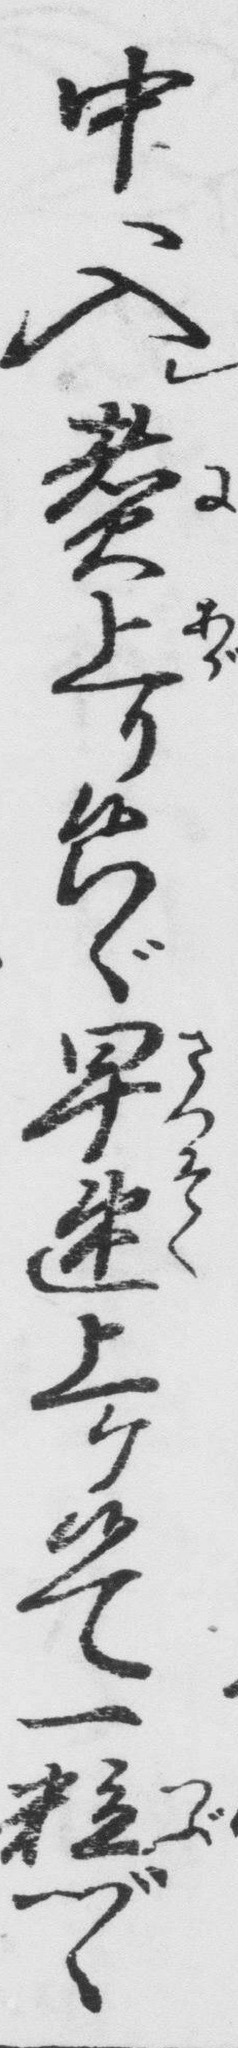中へ入れ煮上り候はゞ早速上け候て一粒づゝ
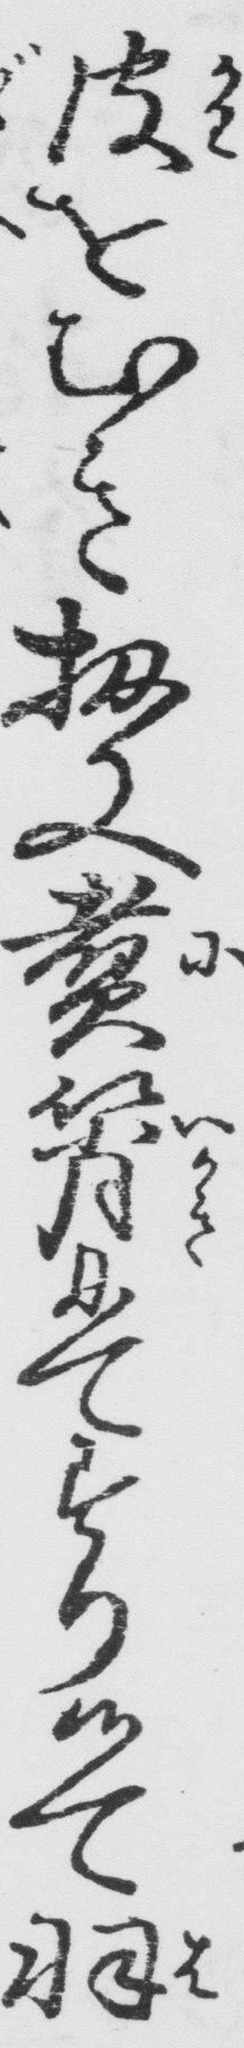皮をむき扨又煮筲にてすり候て羽
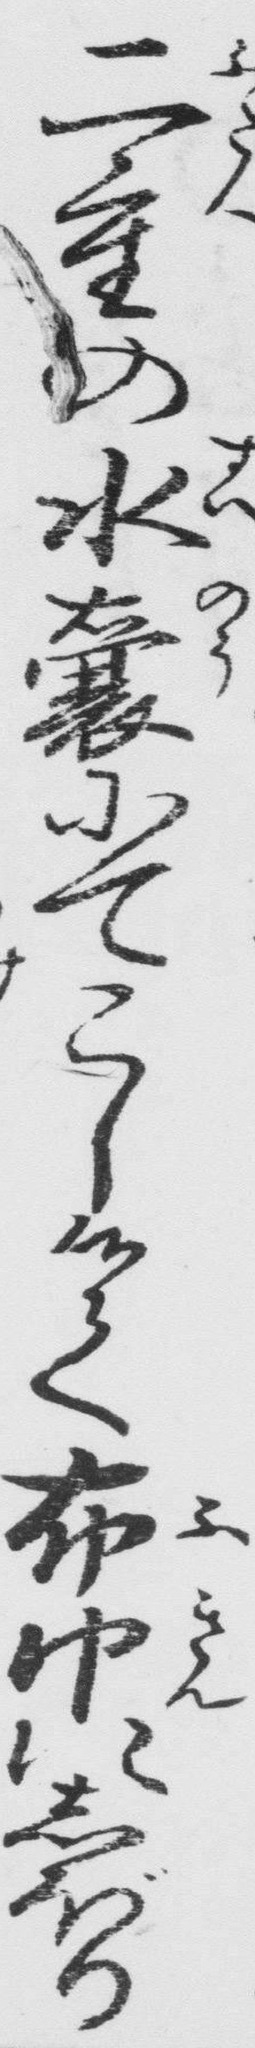二重の水嚢にてこし候て布巾にしぼり
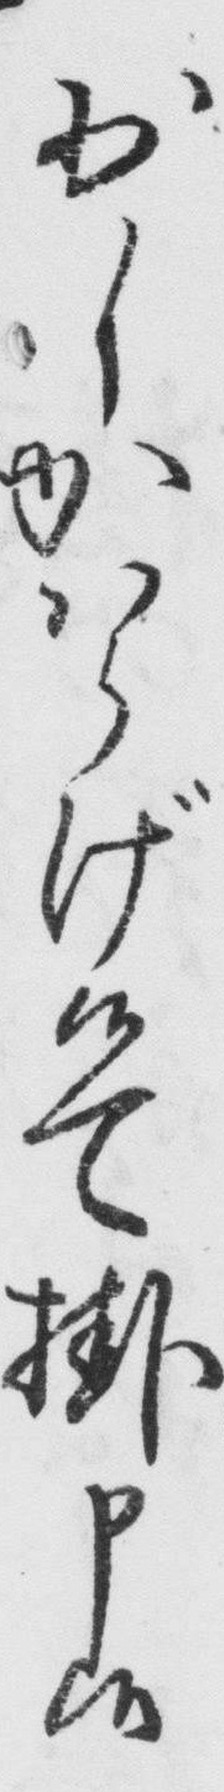少しかはらげ候て掛申候
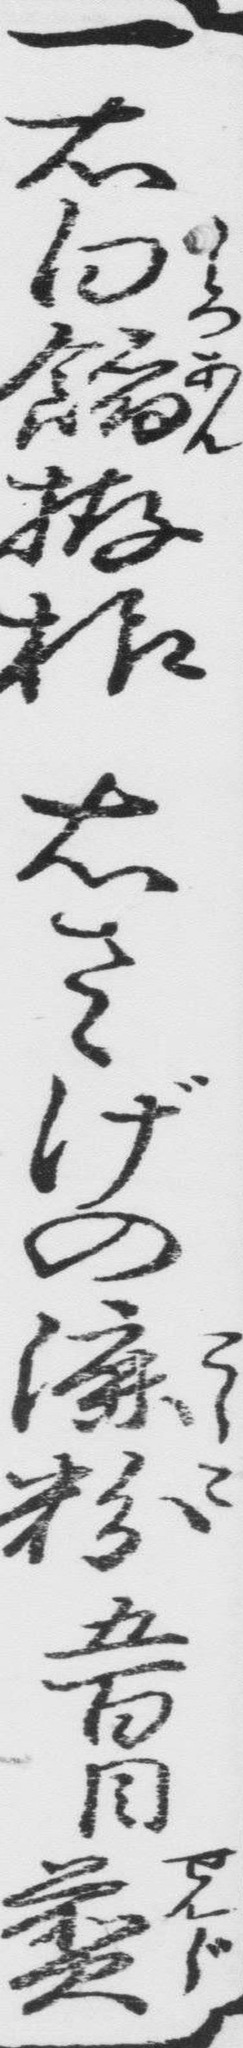一右白餡拵様右さゝげの漉粉五百目煎
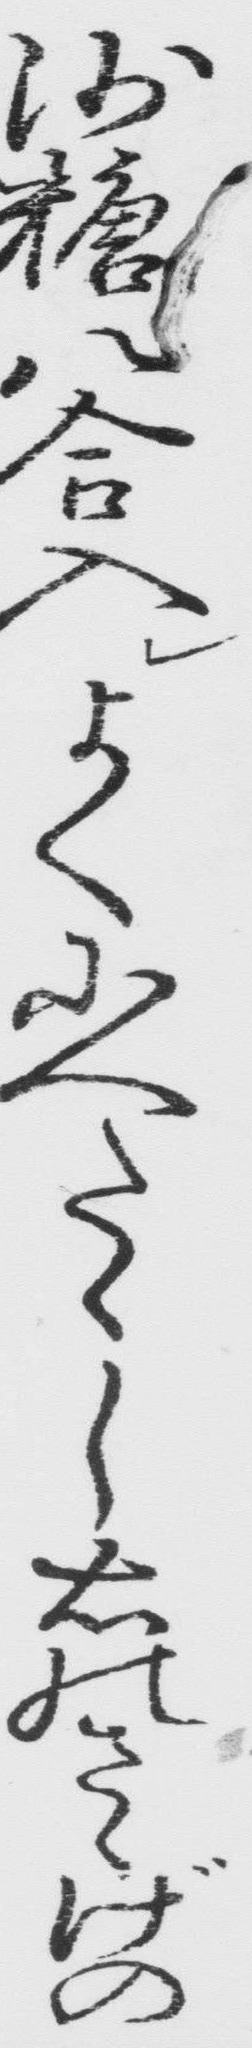沙糖八合入れよくにへたゝし右のさゝげの
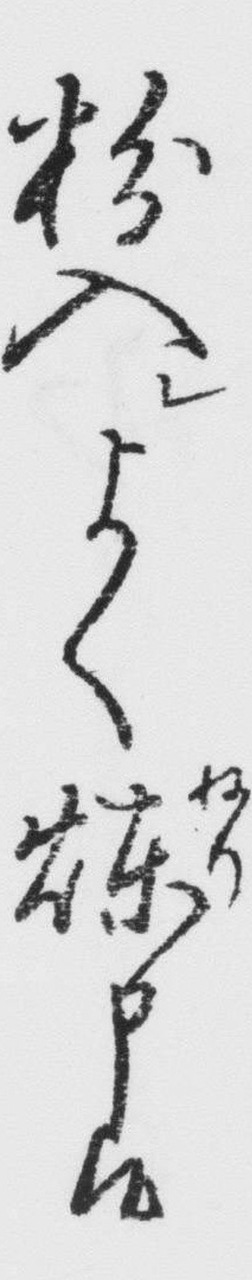粉入れよく煉申候
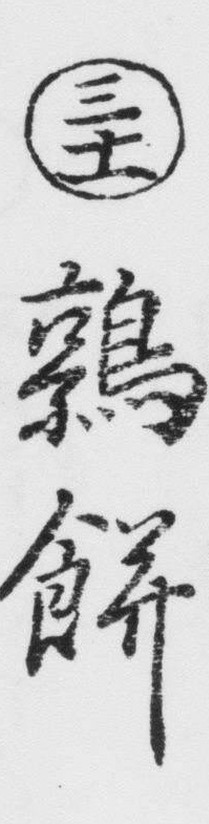(三十一)鶉餅
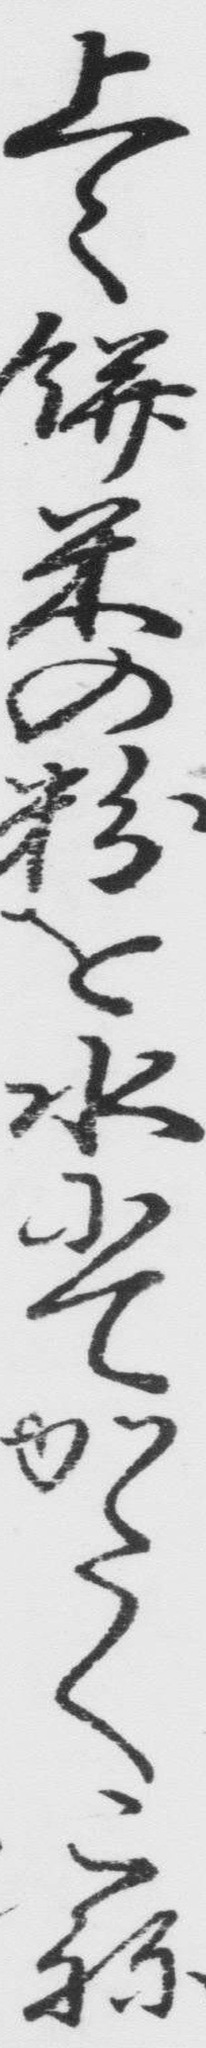上々餅米の粉を水にてかたくこね
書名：御前菓子図式
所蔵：大阪府立大学学術情報センター 国文学研究資料館
